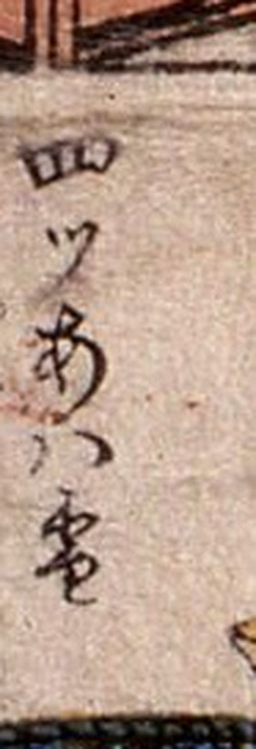四つあは雪
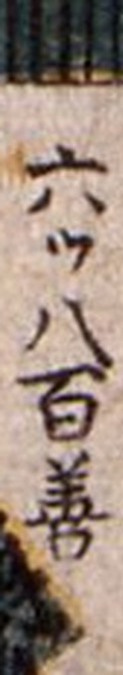六つ八百善
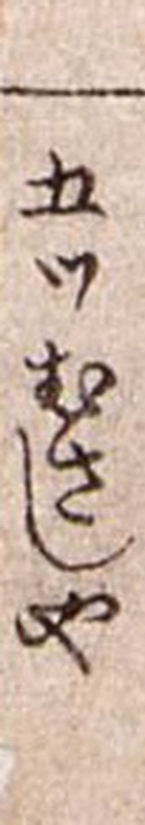五つむさしや
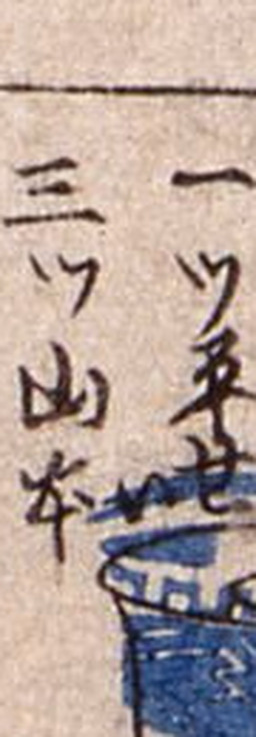三つ山本
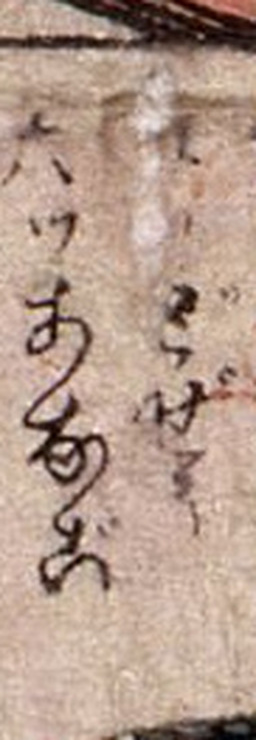六つあなご
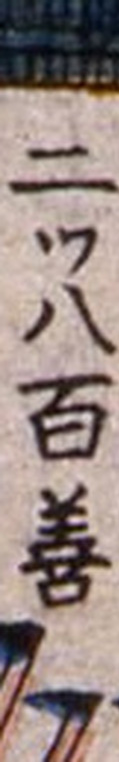二つ八百善
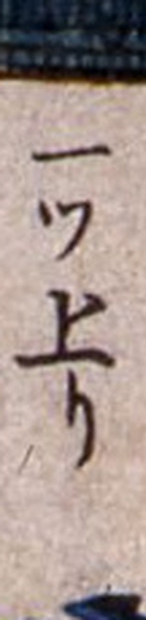一つ上り
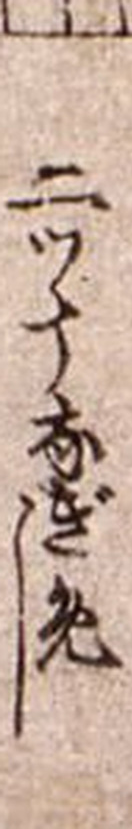二つうなぎめし
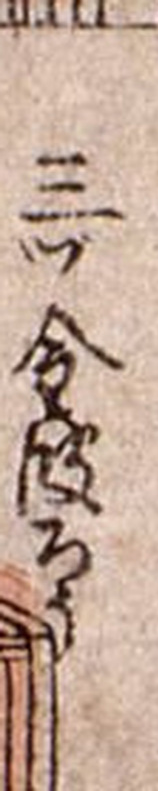三つ金波ろう
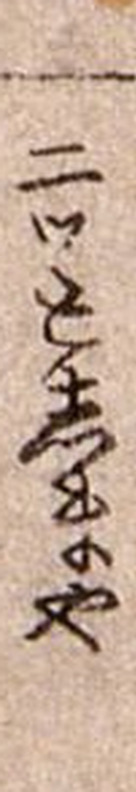二つとしまや
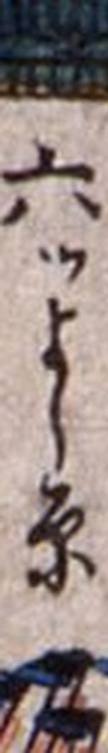六つよし原
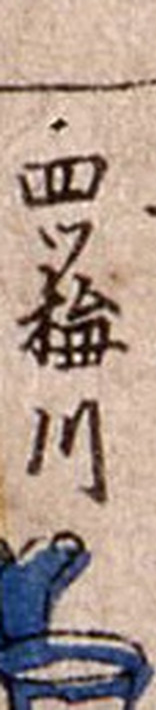四つ梅川
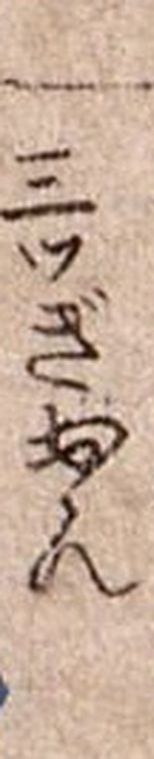三つぎおん
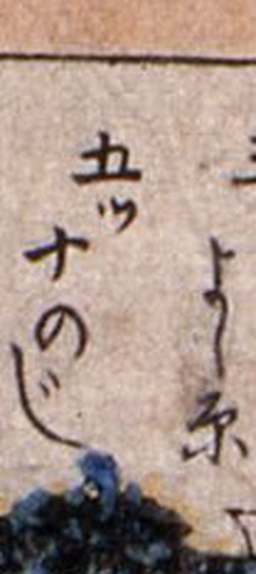五つ十のじ
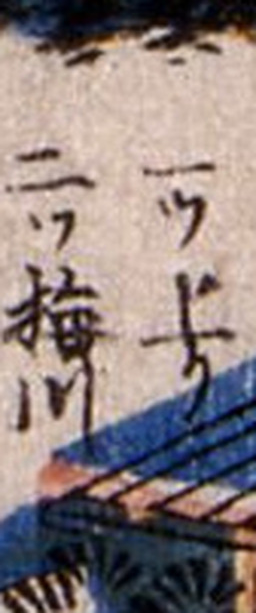二つ梅川
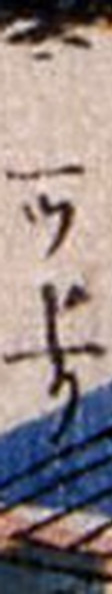一つ上り
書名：新版御府内流行名物案内雙六
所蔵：東京学芸大学附属図書館
